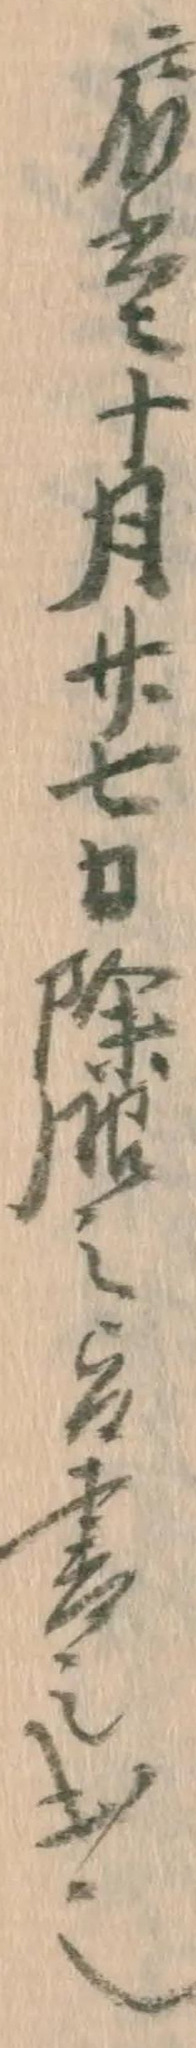肩書ニ十月廿七日除服之旨書之出也
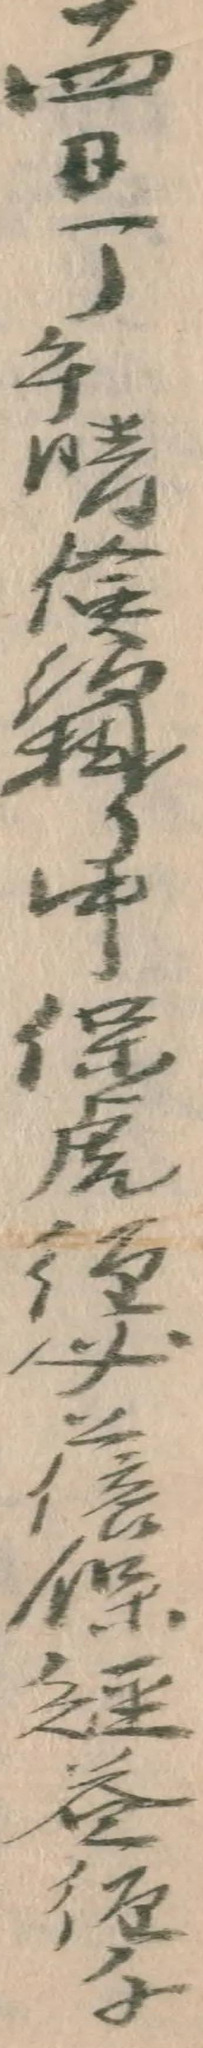十四日丁午晴倹約掛り中保虎経必蓓保経益経子
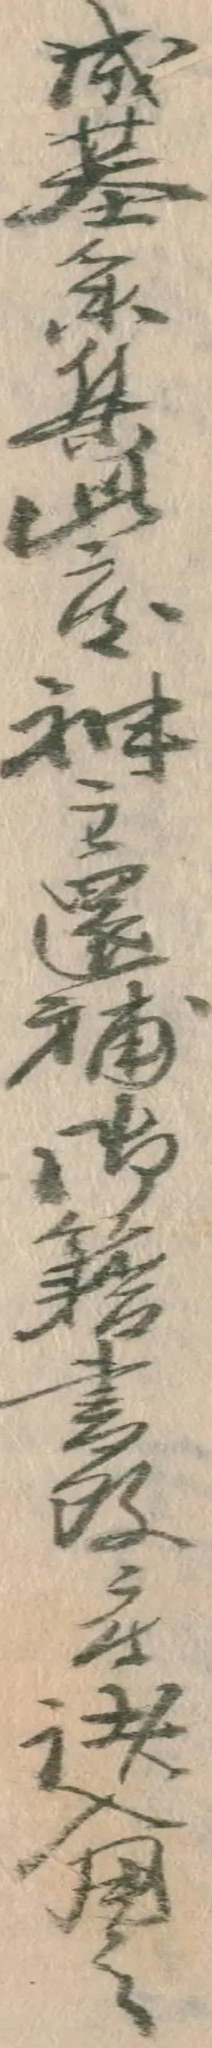成基参集此度神主還補御籍書改ニ付諸入用之
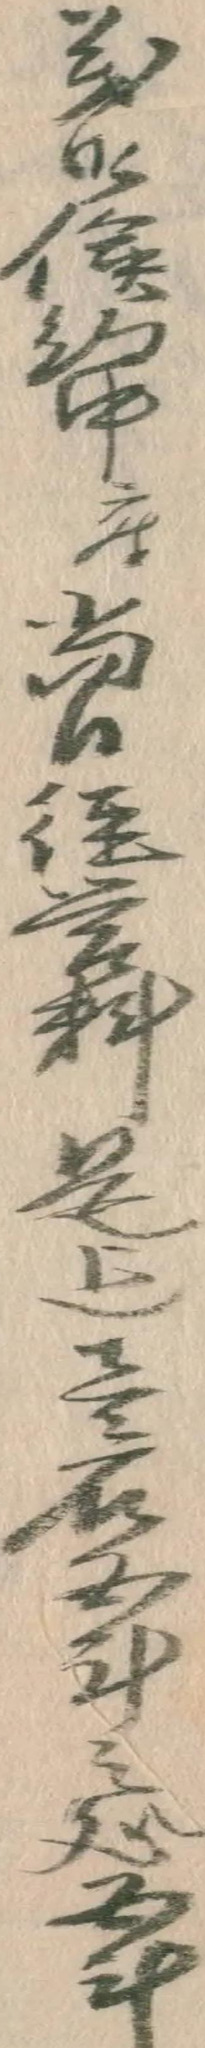義御倹約中ニ付當日経営料是迄壱石五斗之処五斗
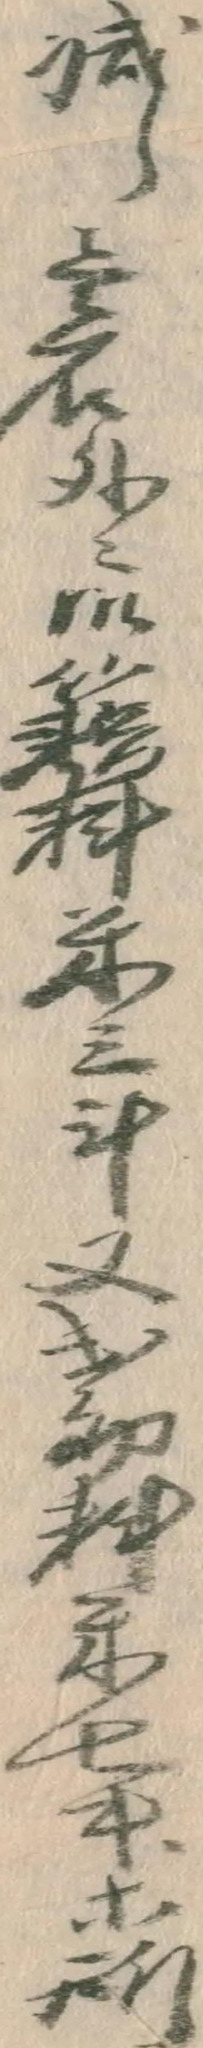減し壱石外ニ御籍料米三斗又出勤料米七升等所
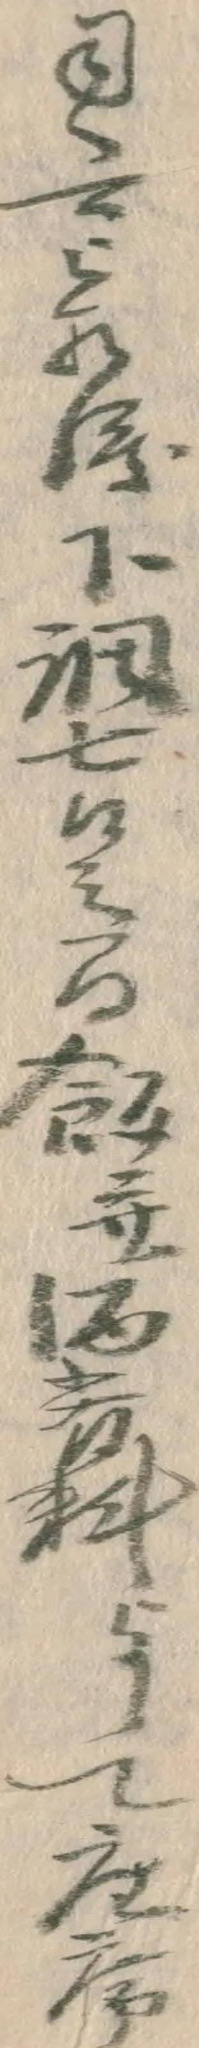司へ可被相渡下調七日之間飯并酒肴料として座席
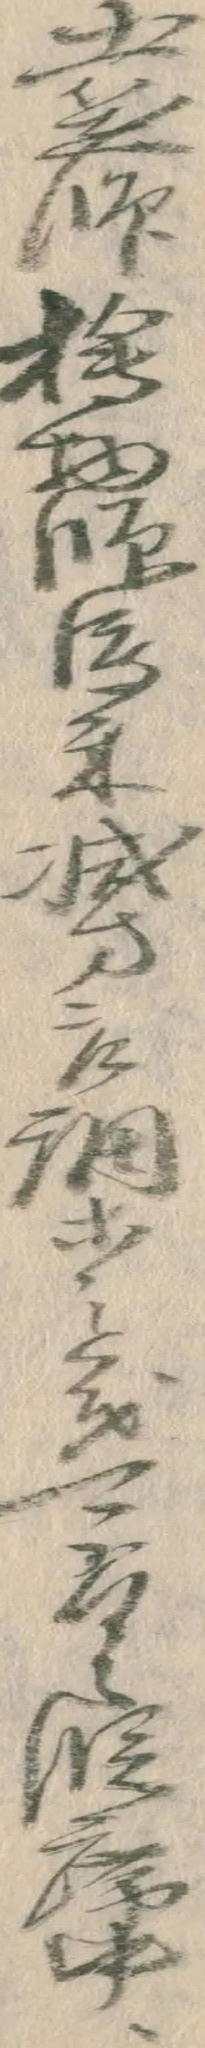出器師檜物師後米減方取調等之義可有之段席中へ
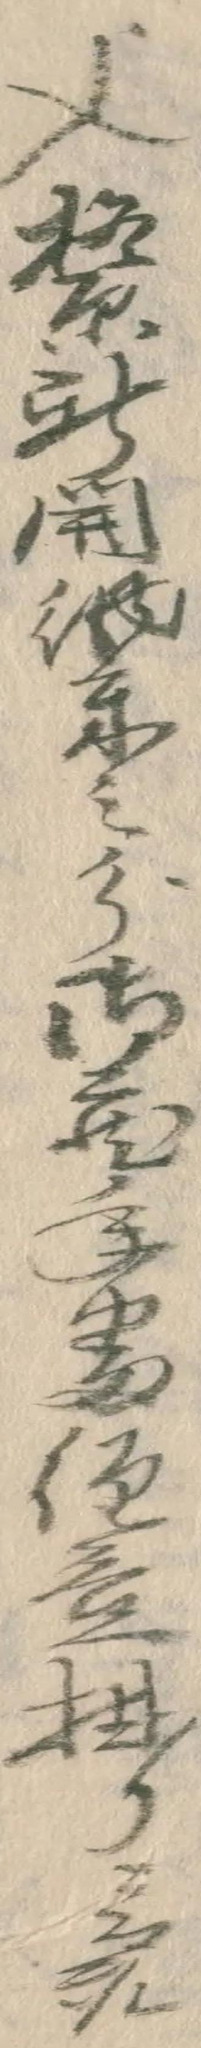申入柊原新開納米之分御蔵年番経益掛りニ而取
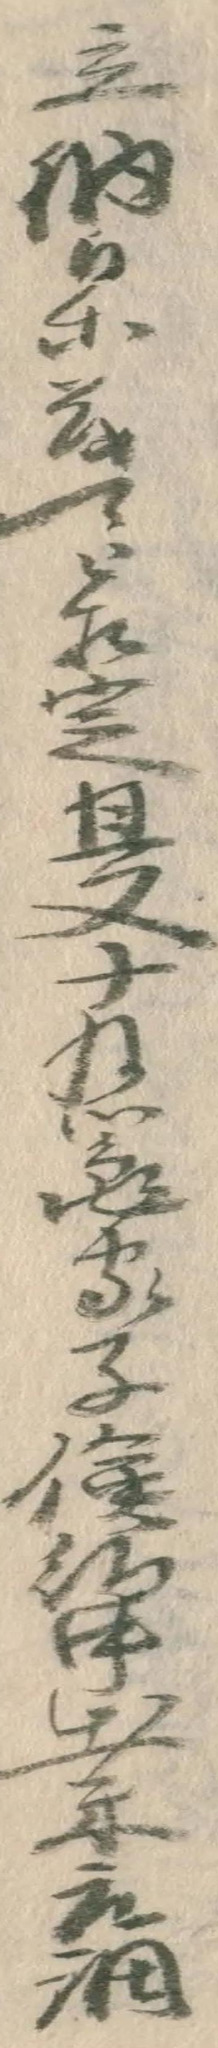立納候等茂可被相定且又十月鬮家子倹約中出来取調
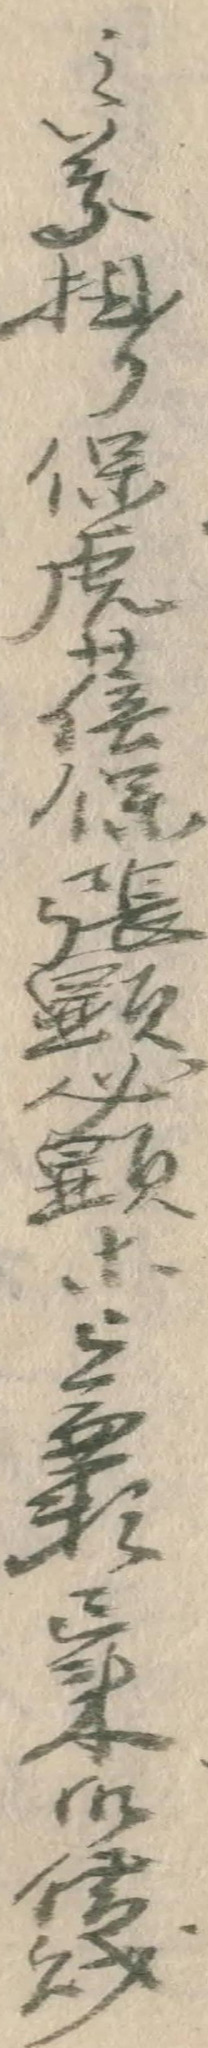之義掛り保虎蓓保張顕必顕等被兼頼已来御借財
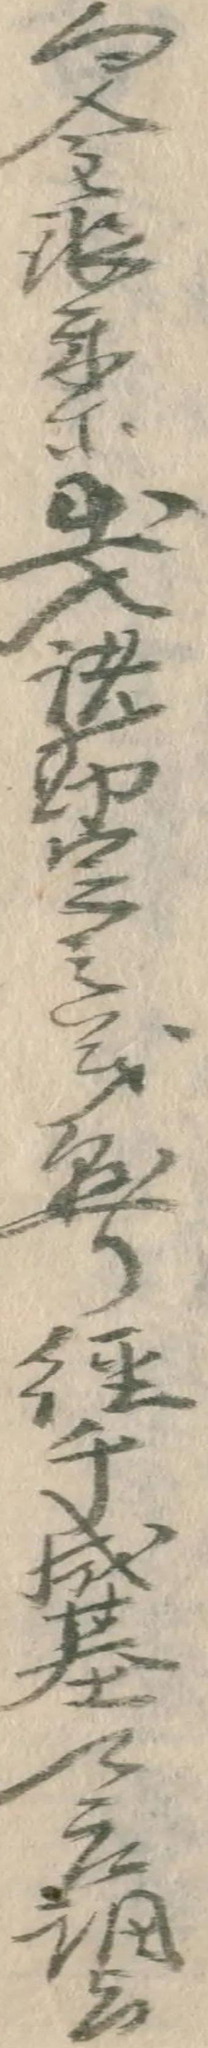向金銀米等出入諸勘定之義懸り経千成基可取調旨
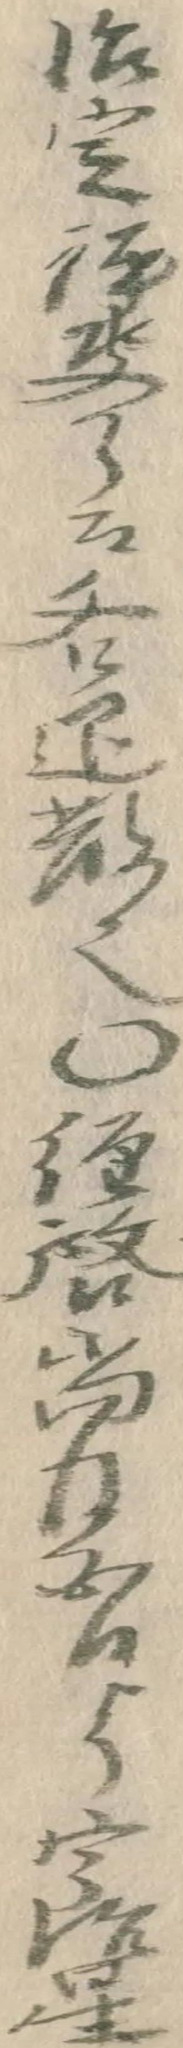治定評決了而各退散也○経啓當月五日より宇治星

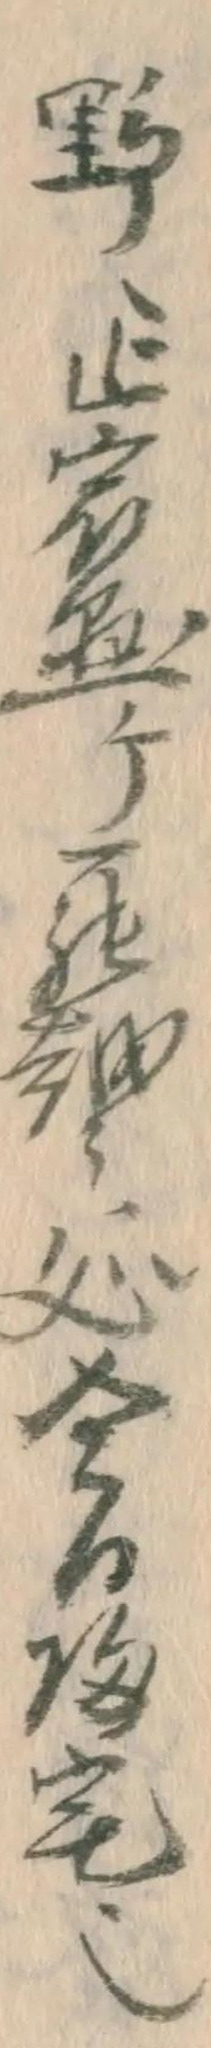野へ止宿懸ヶ罷越之処今日帰宅也
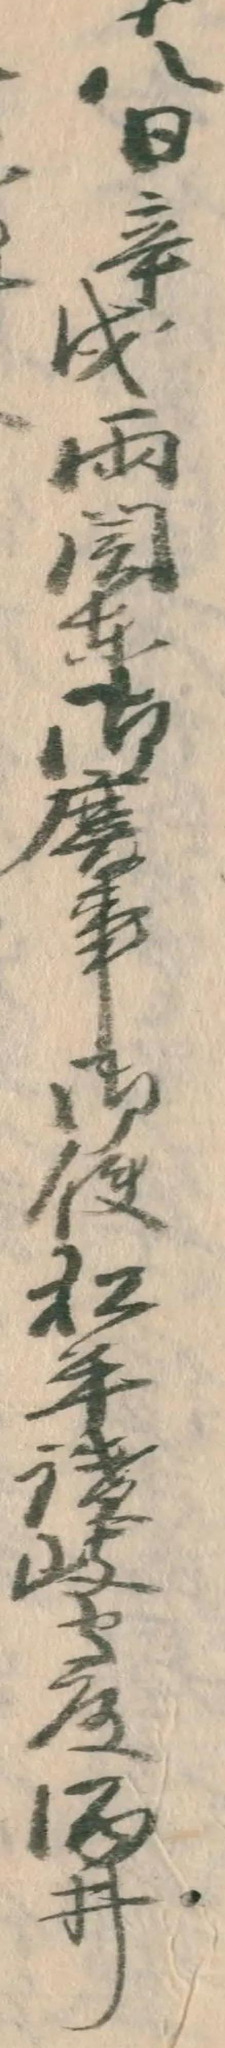十八日辛戌両関東御慶事御使松平讃岐守殿酒井
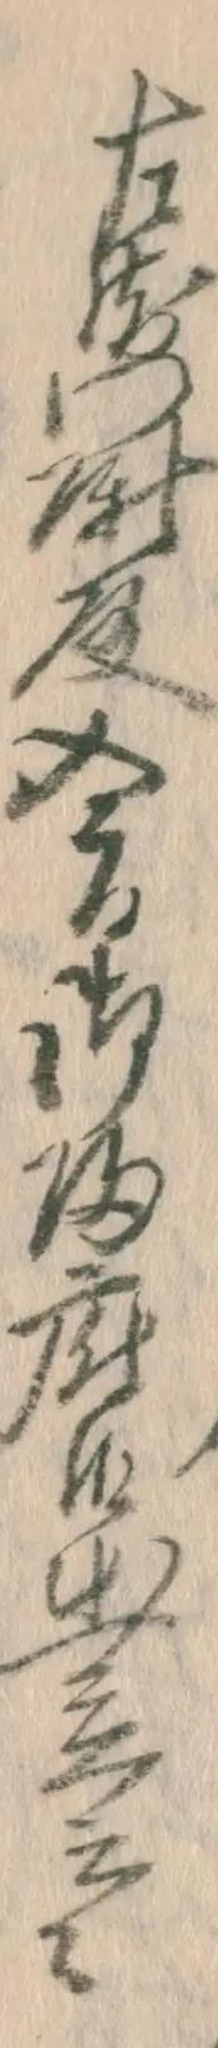左衛門尉殿今日御帰府御出立云々
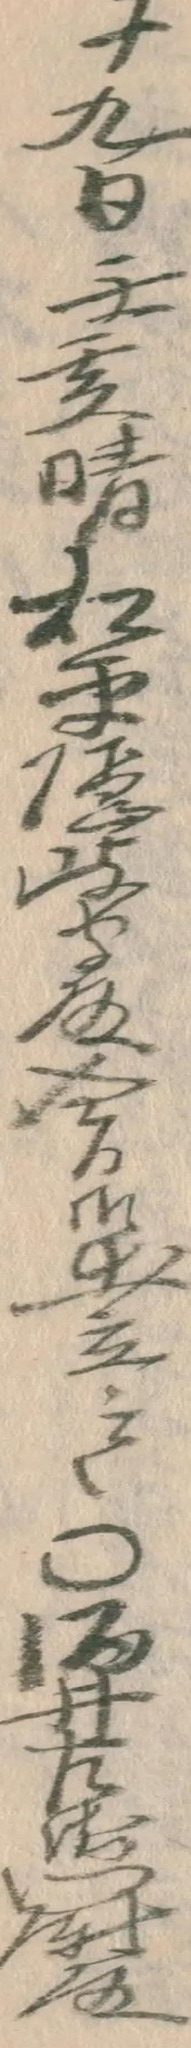十九日壬亥晴松平隠岐守殿今御出立云々〇酒井左衛門尉殿
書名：賀茂社記録. 第67冊
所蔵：国立国会図書館 National Diet Library, JAPAN
